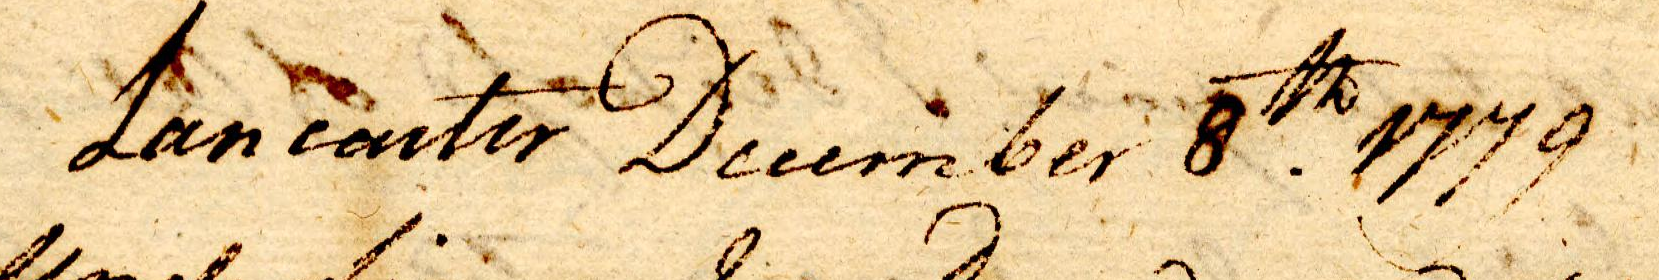Lancaster December 8^th. 1779
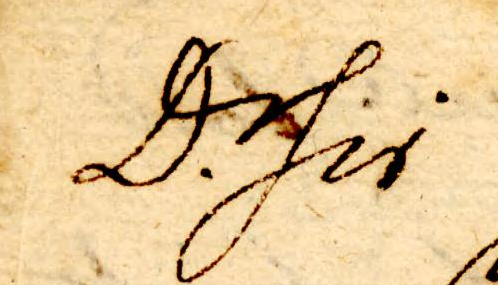D^r. Sir
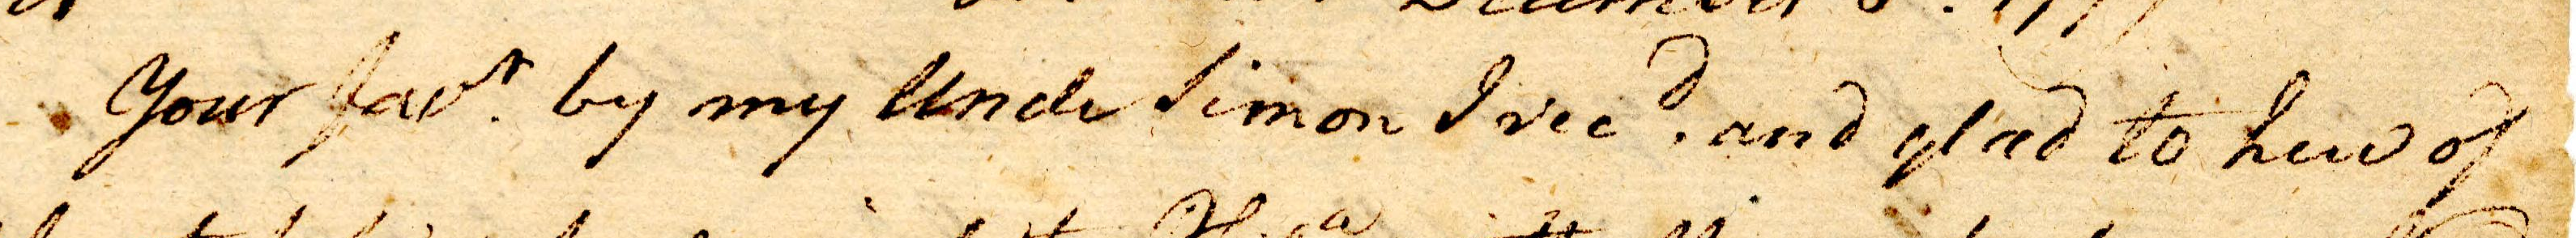Your fav^r. by my Uncle Simon I rec^d. and glad to here of
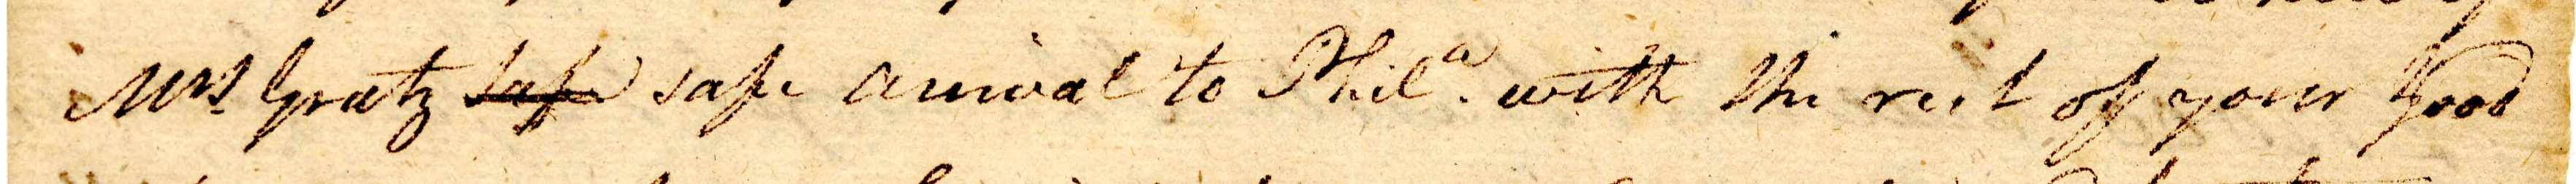M^r Gratz [Safe] safe arrival to Phil^a. with the rest of your good
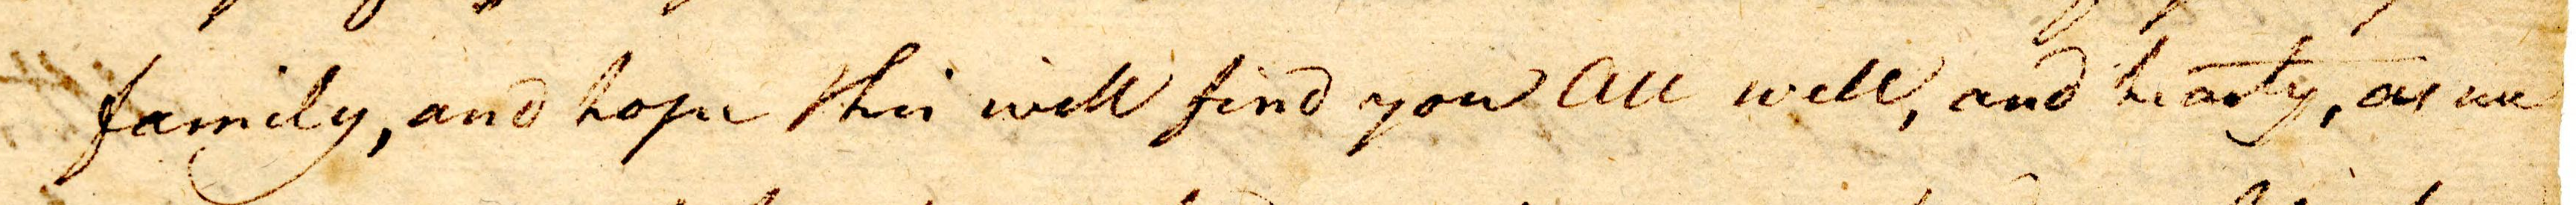family, and hope this well find you all well, and hearty, as are
